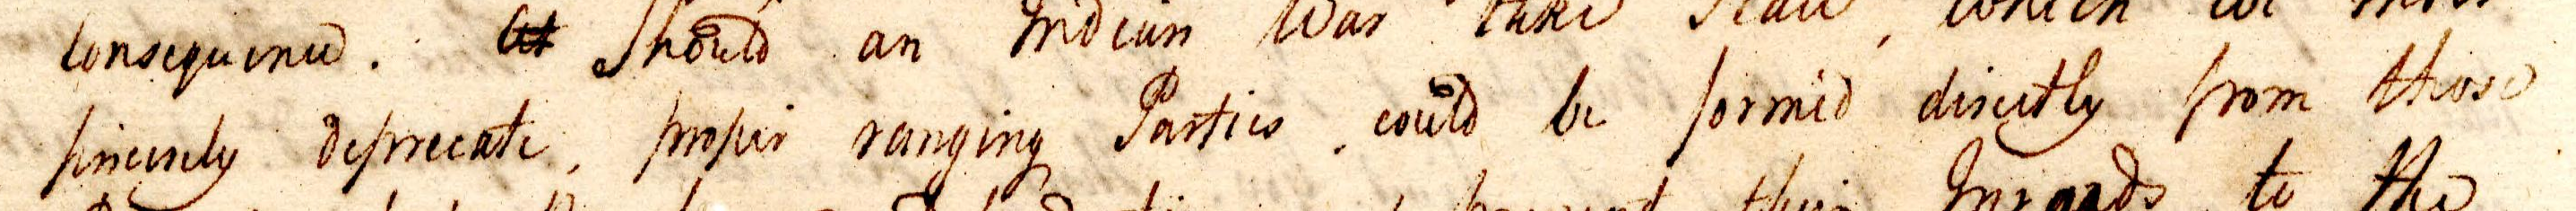sincerely deprecate, proper ranging Parties could be formed directly from those
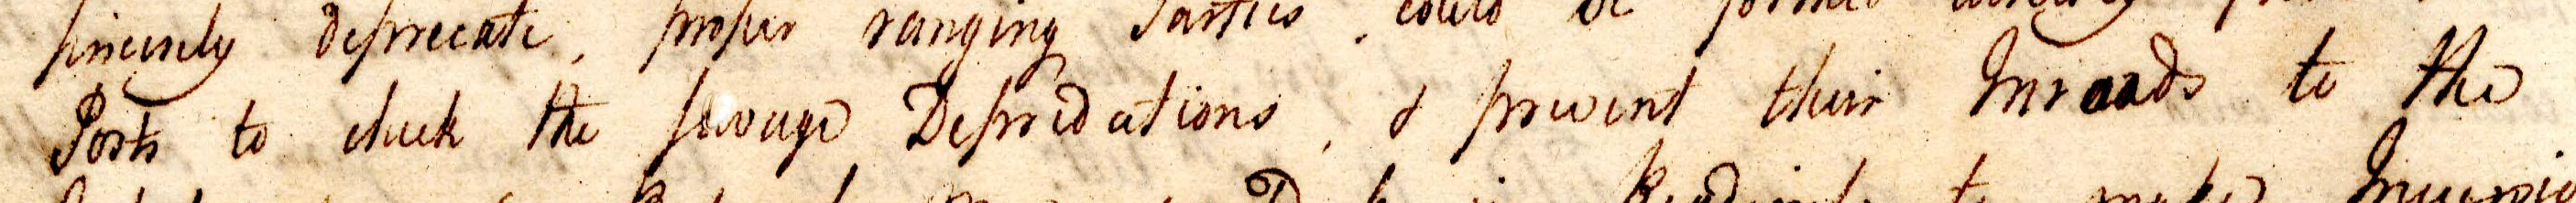Ports to check the Savage Depredations & prevent their Inroads to the
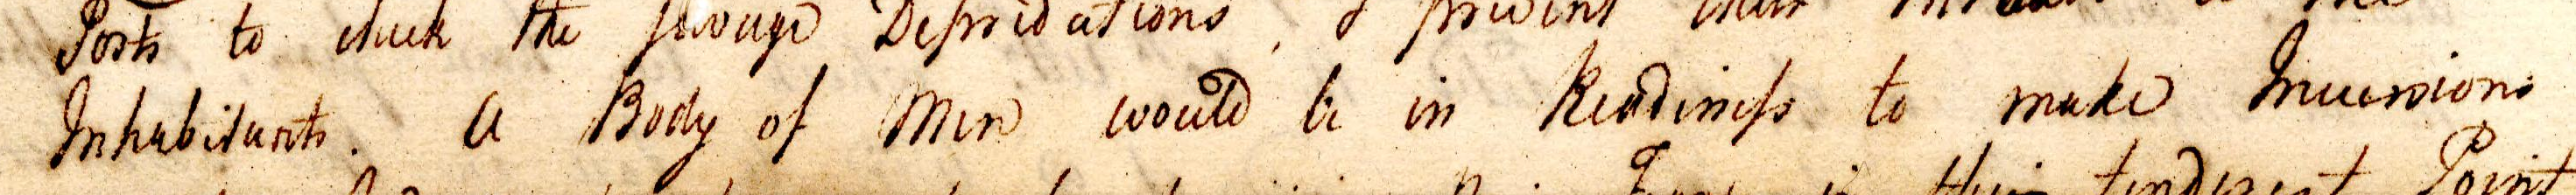Inhabitants. A Body of Men would be in Readiness to make Incursions
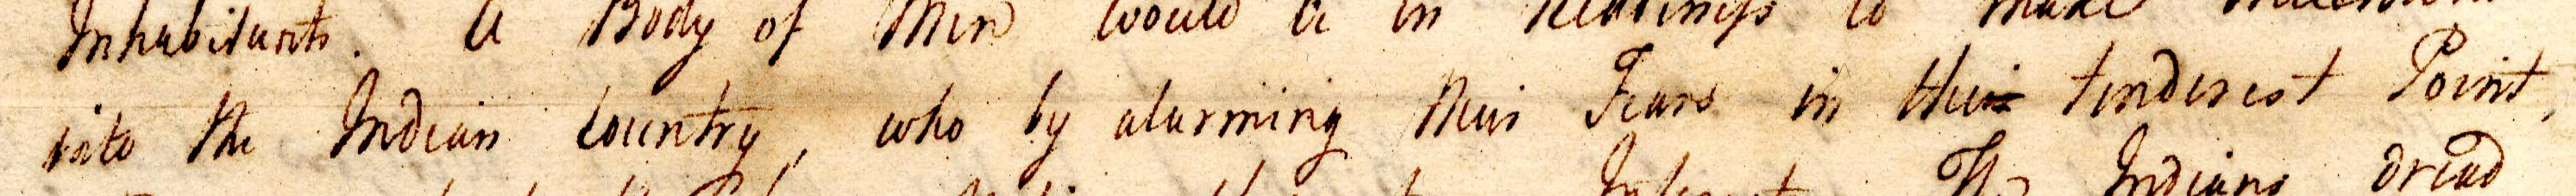into the Indian Country, who by alarming their Fears in their tenderest Point,
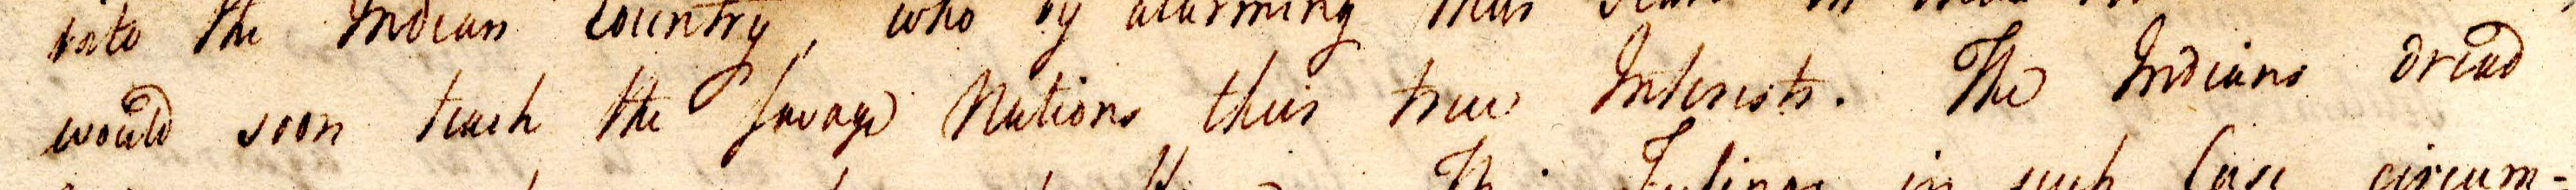would soon teach the Savage Nations their true Interests. The Indians dread
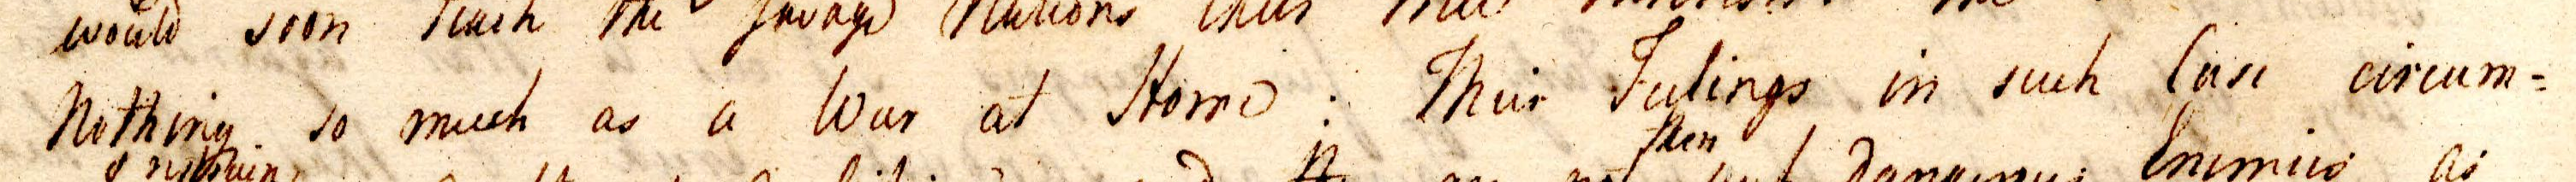Nothing so much as a War at Home: Their Feelings in such Case circum-
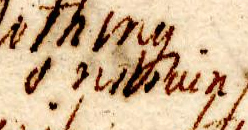& retain
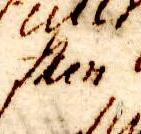then
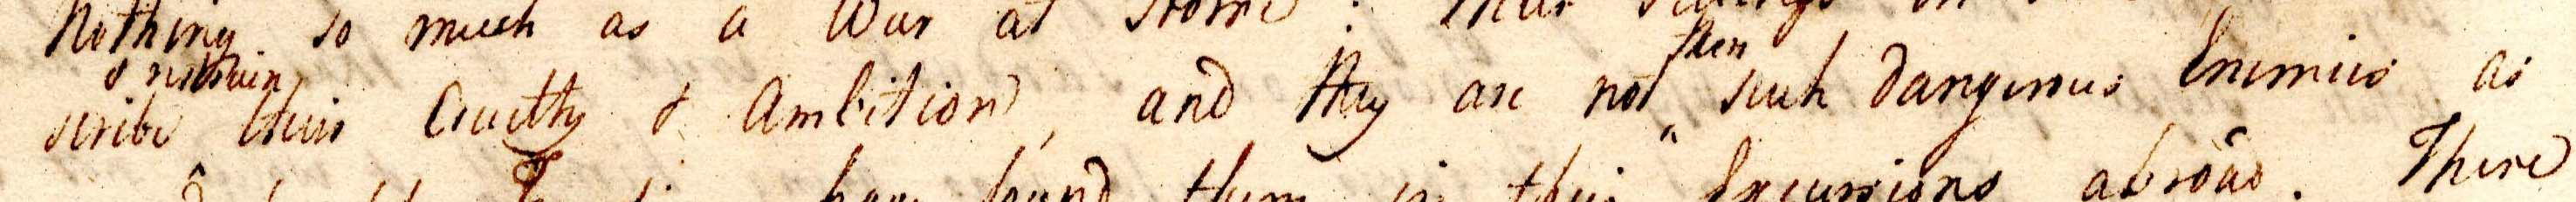scribe ^ their Cruelty & Ambition, and they are not ^ such dangerous Enemies as
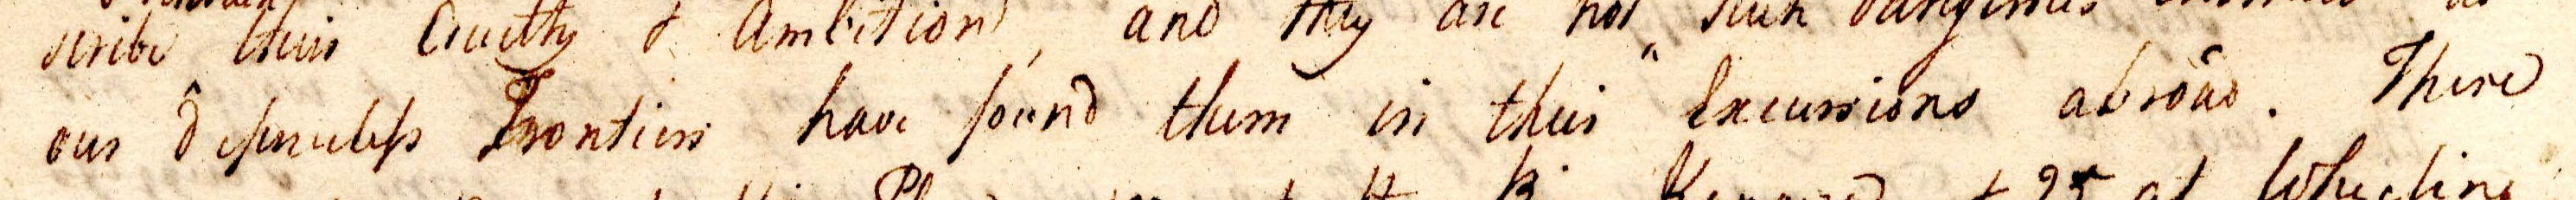our defenseless frontiers have found them in their Excursions abroad. There
